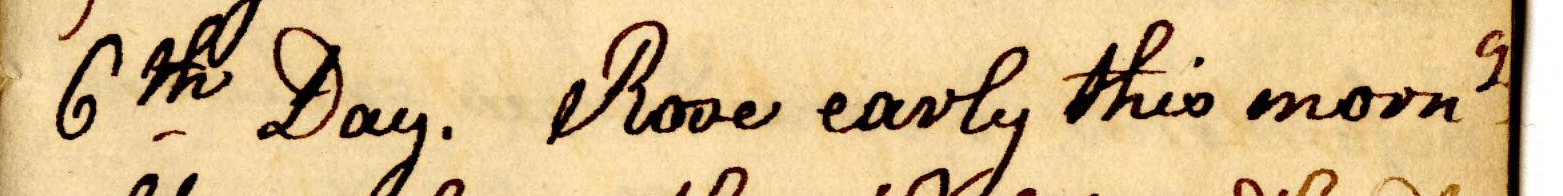6^th Day. Rose early this morn^g
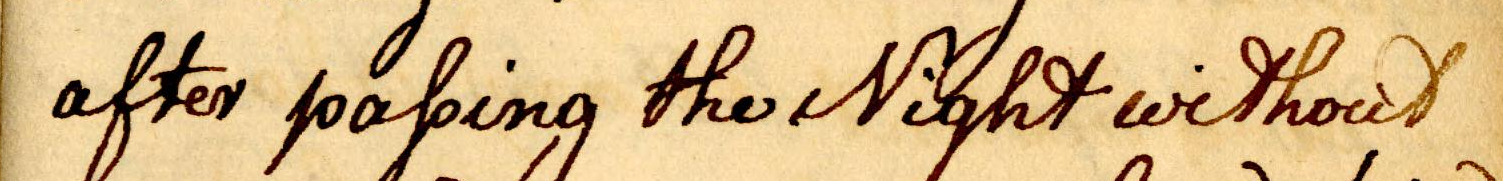after passing the Night without
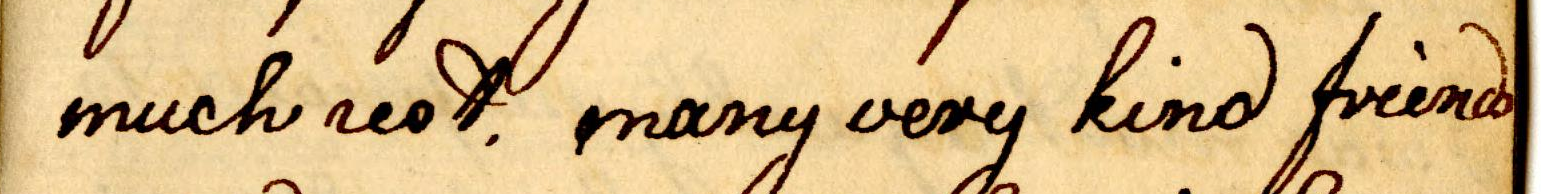much rest, many very kind friends
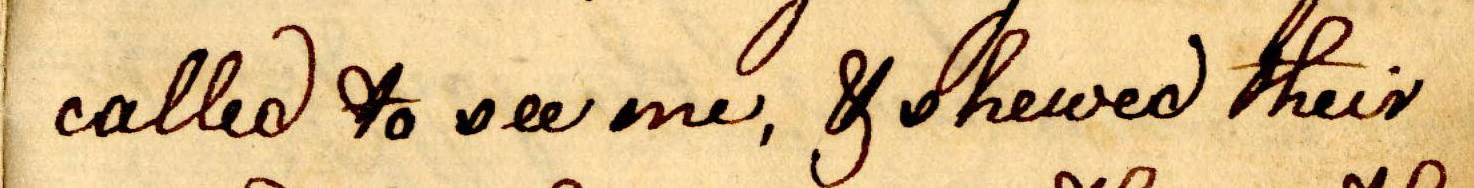called to see me, & shewed their
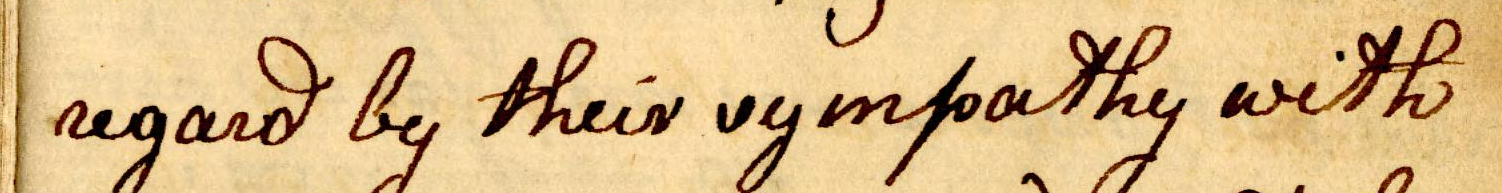regard by their sympathy with
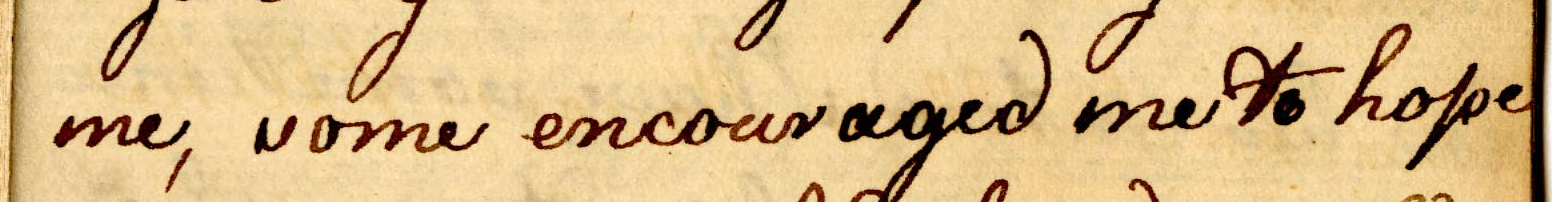me, some encouraged me to hope
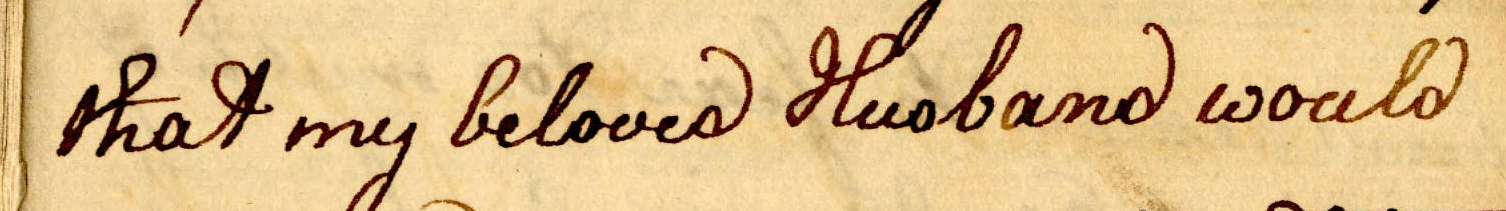that my beloved Husband would
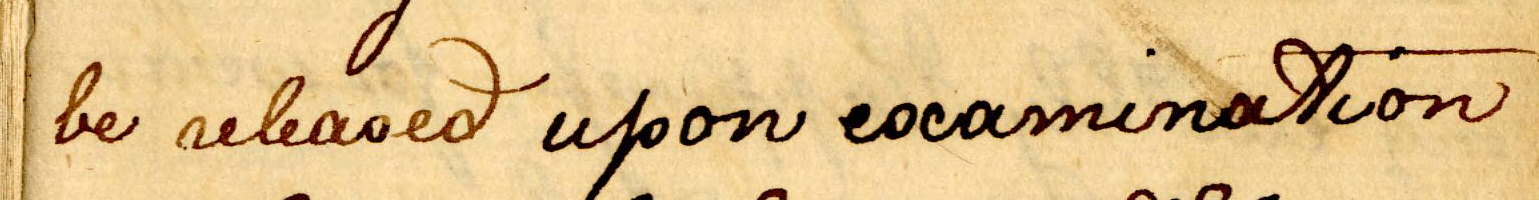be released upon examination
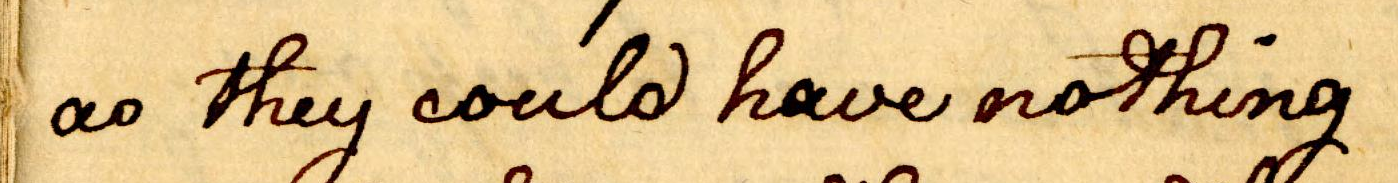as they could have nothing
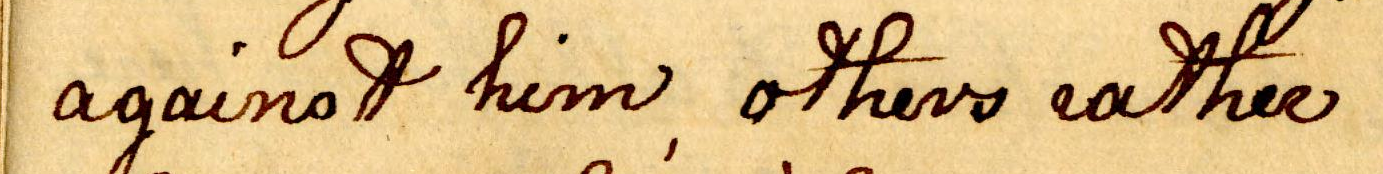against him, others rather
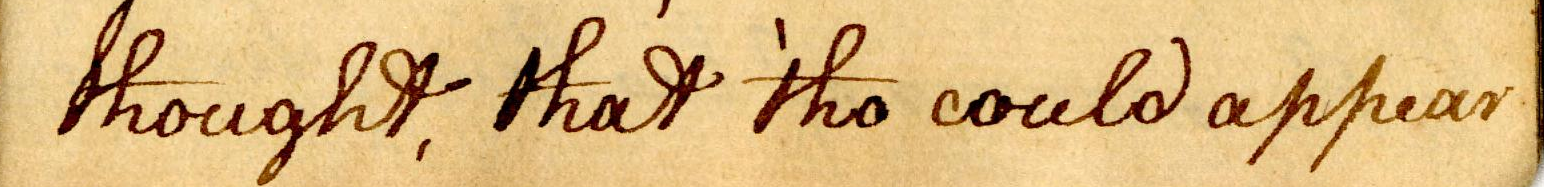thought, that tho could appear
